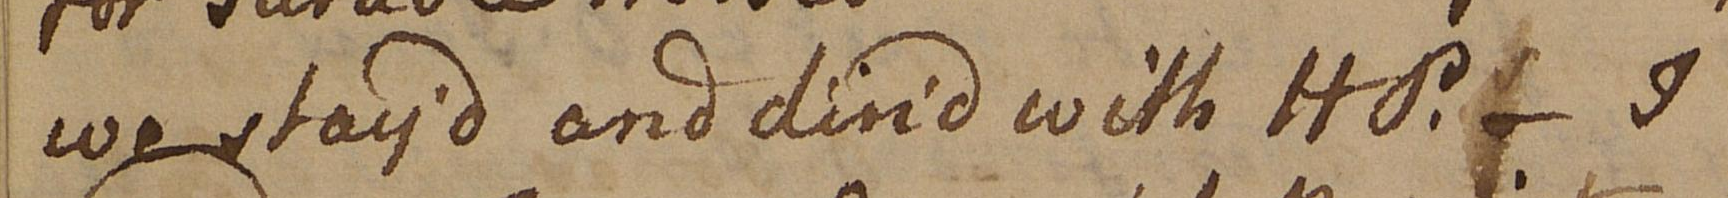we stay'd and din'd with HP.- I
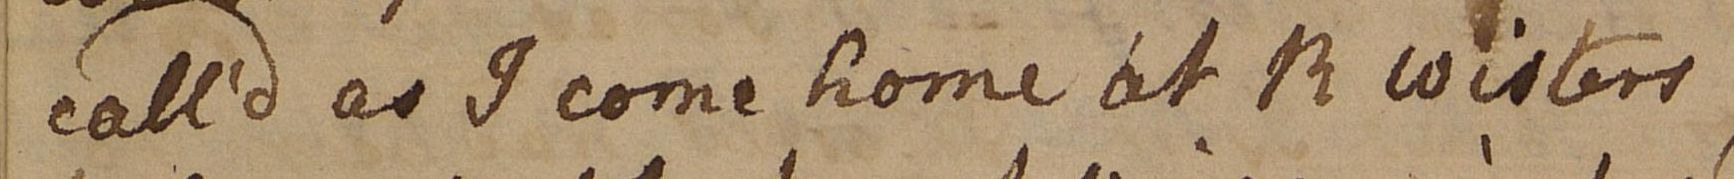call'd as I come home at R Wisters
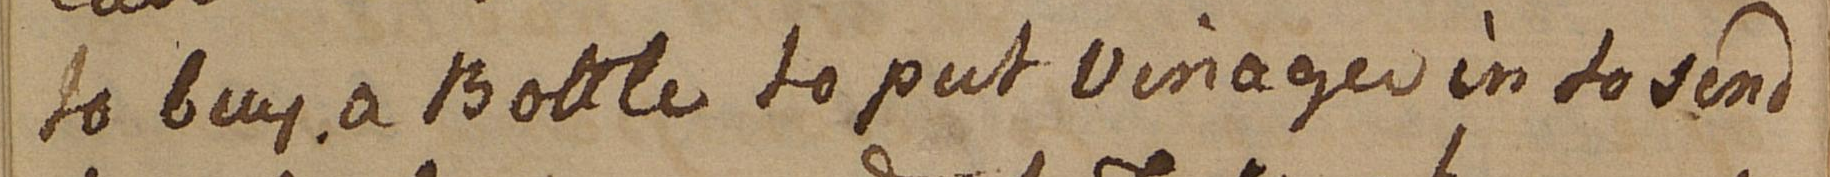to buy a Bottle to put Vinager in to send
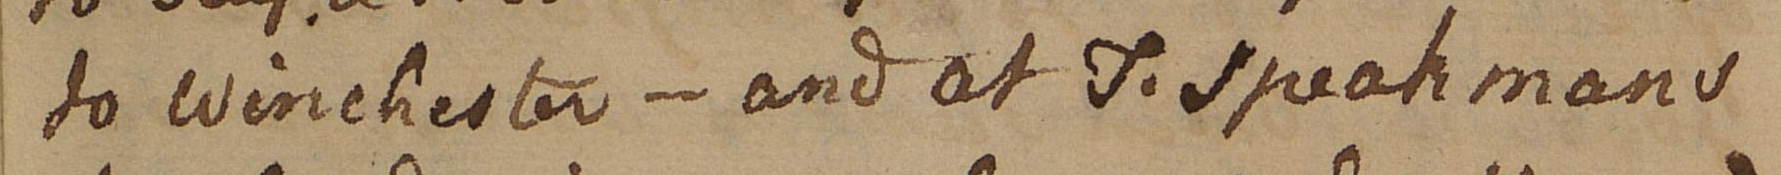to Winchester- and at T. Speakmans
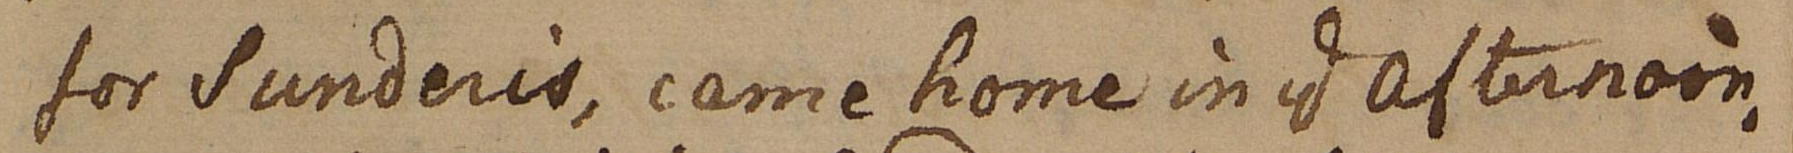for Sunderis, came home in y^e afternoon,
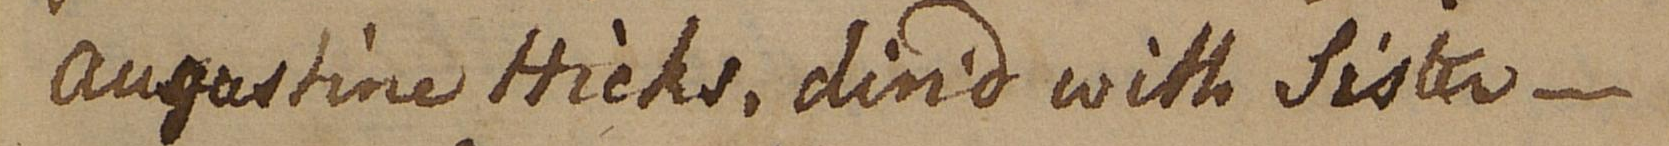Augustine Hicks, din'd with Sister-
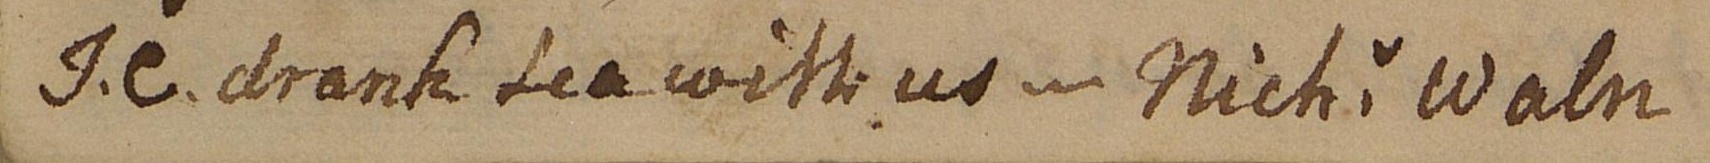J.C. drank tea with us- Nich^s. Waln
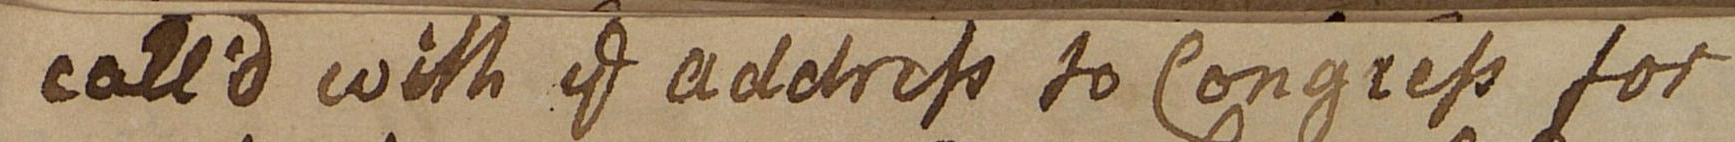calld with y^e address to Congress for
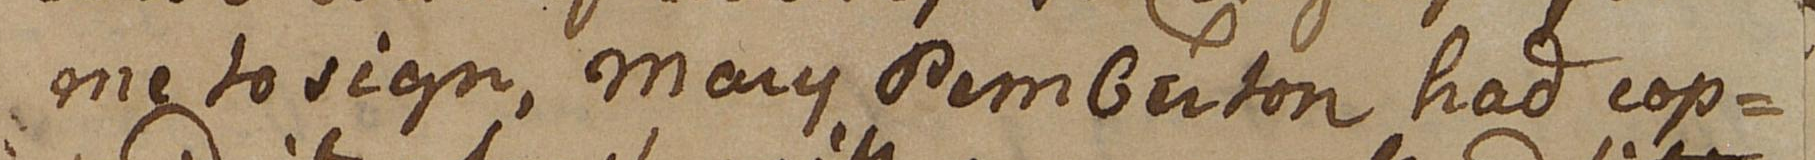me to sign, Mary Pemberton had cop-
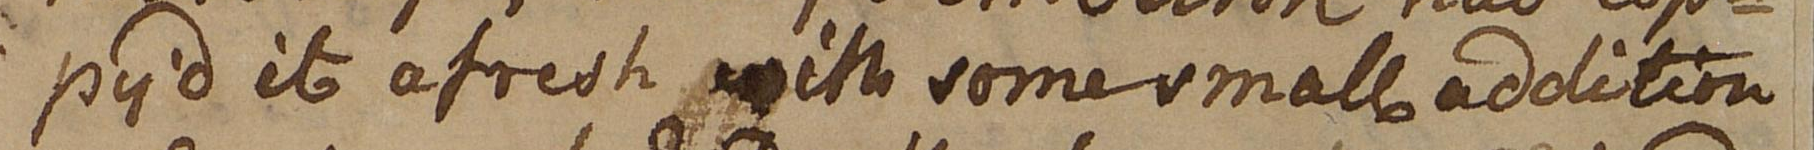py'd its afresh with some small addition
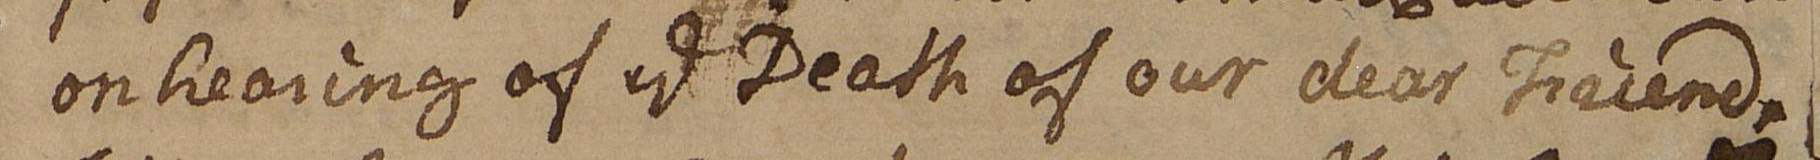on hearing of y^e Death off our dear Friend-
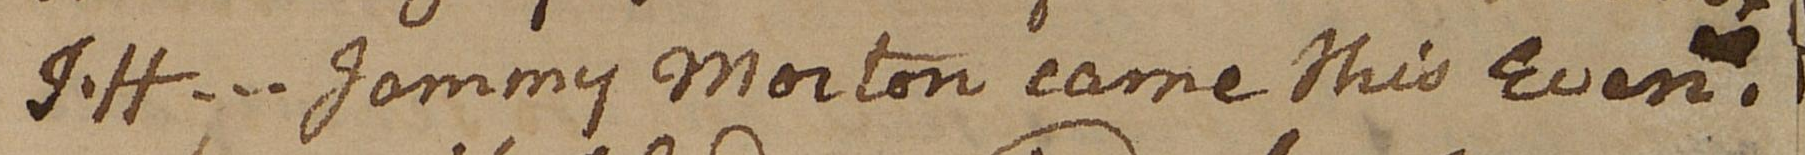J.H-- Jammy Morton came this Even^[_].
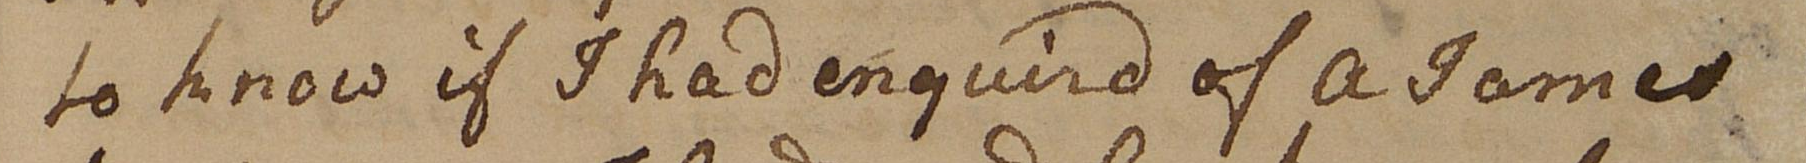to know if I had enquird of A James
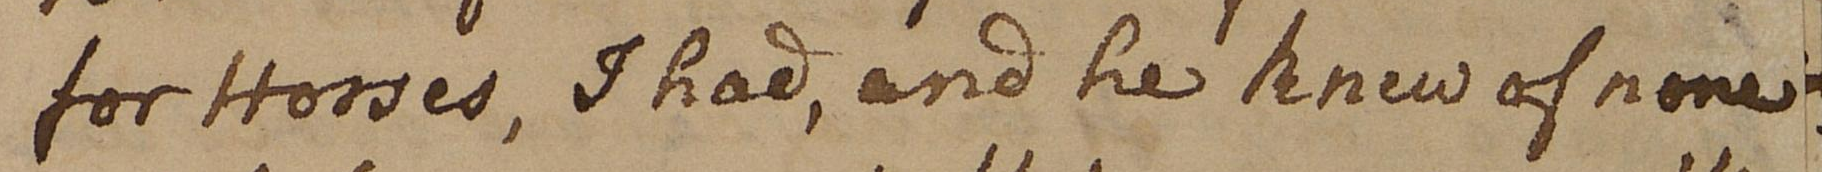for Horses, I had, and he knew of none
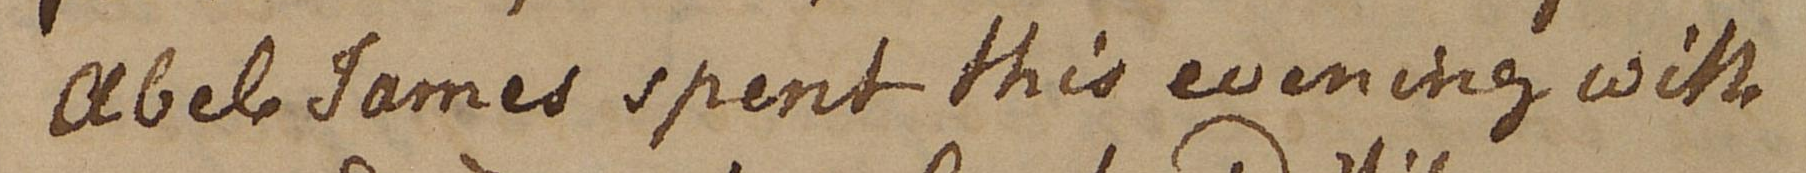Abel James spent this evening with
